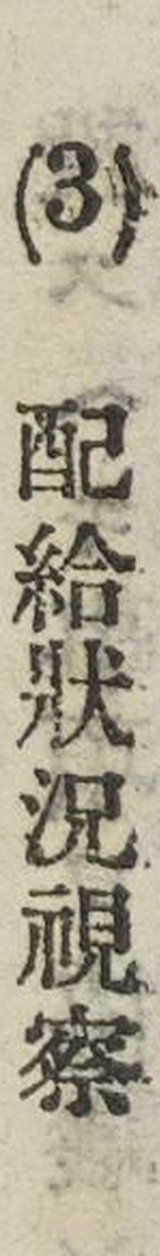⑶配給状況視察
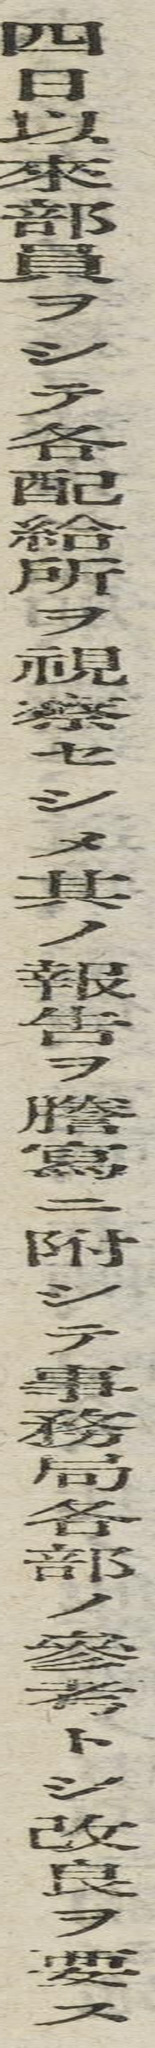四日以来部員ヲシテ各配給所ヲ視察セシメ其ノ報告ヲ謄写ニ附シテ事務局各部ノ参考トシ改良ヲ要ス
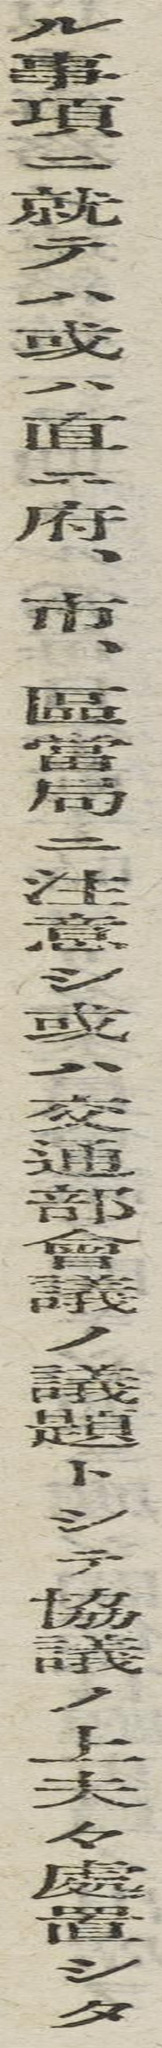ル事項ニ就テハ或ハ直ニ府、市、区当局ニ注意シ或ハ交通部会議ノ議題トシテ協議ノ上夫々処置シタ
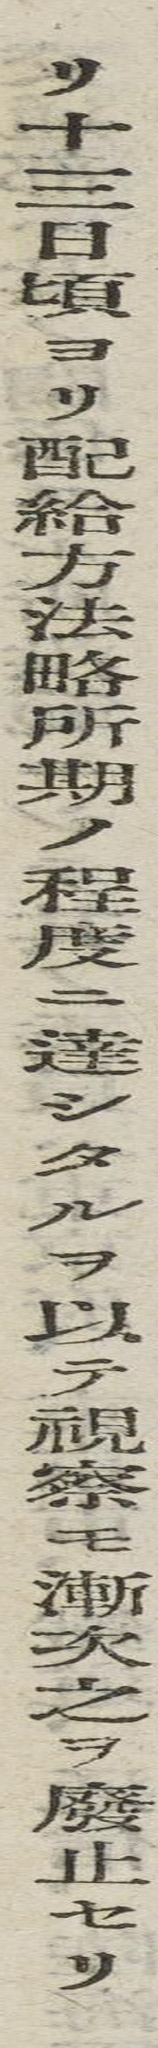リ十三日頃ヨリ配給方法略所期ノ程度ニ達シタルヲ以テ視察モ漸次之ヲ廃止セリ
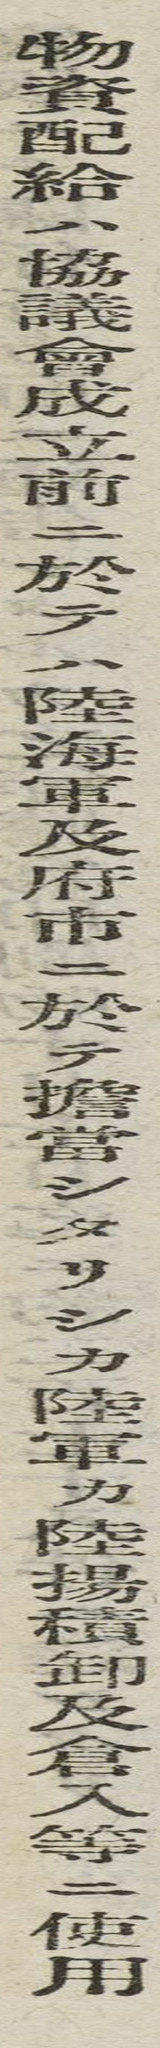物資配給ハ協議会成立前ニ於テハ陸海軍及府市ニ於テ担当シタリシカ陸軍カ陸揚積卸及倉入等ニ使用
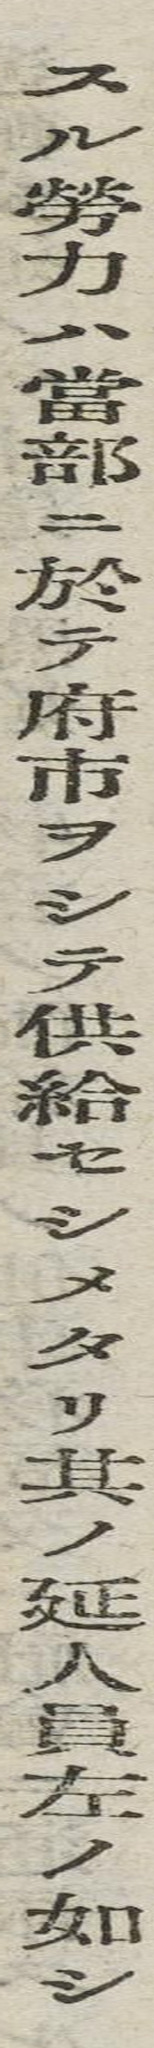スル労力ハ当部ニ於テ府市ヲシテ供給セシメタリ其ノ延人員左ノ如シ
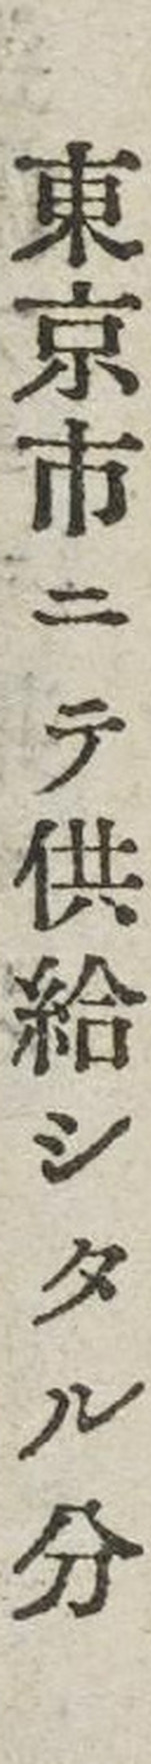東京市ニテ供給シタル分
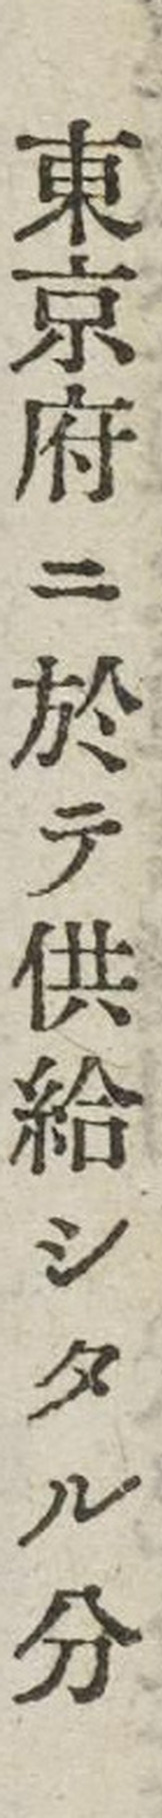東京府ニ於テ供給シタル分
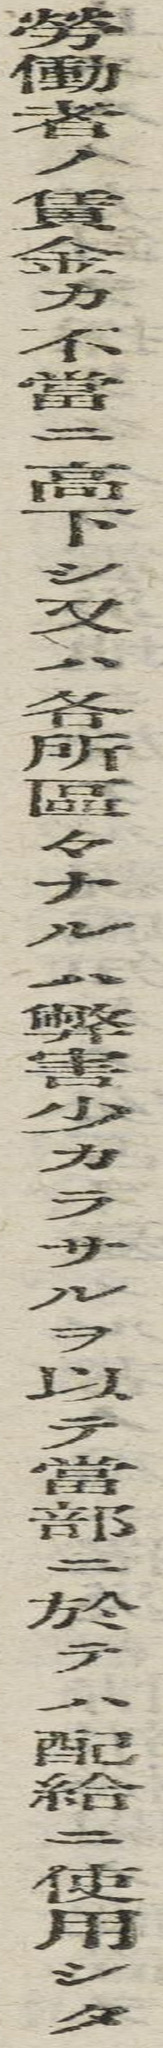労働者ノ賃金カ不当ニ高下シ又ハ各所区々ナルハ弊害少カラサルヲ以テ当部ニ於テハ配給ニ使用シタ
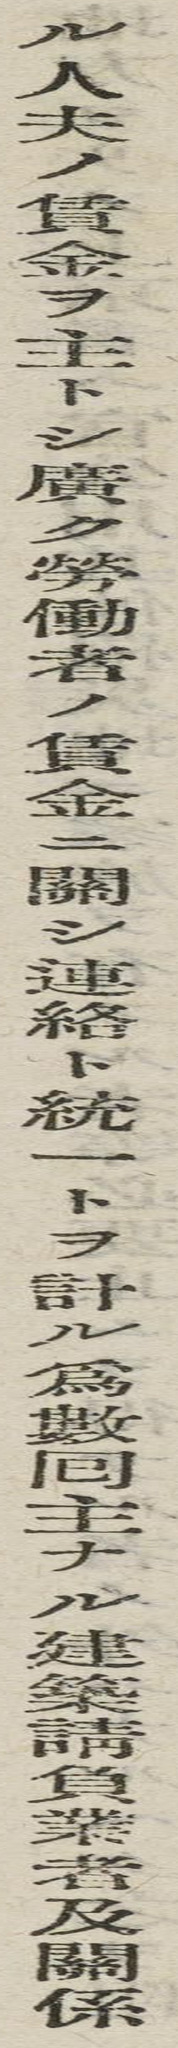ル人夫ノ賃金ヲ主トシ広ク労働者ノ賃金ニ関シ連絡ト統一トヲ計ル為数回主ナル建築請負業者及関係
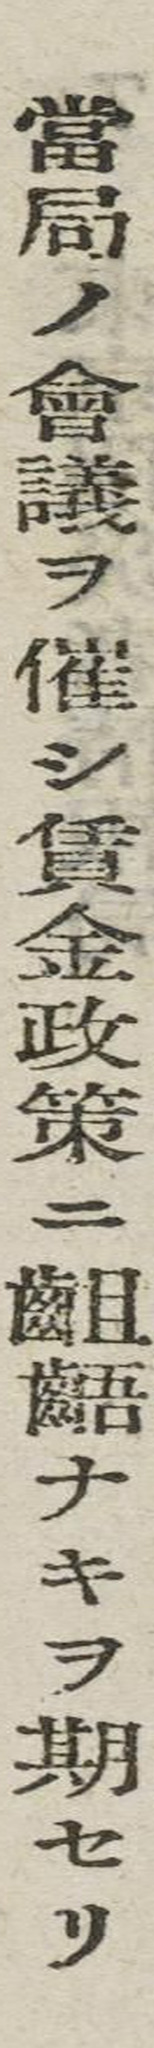当局ノ会議ヲ催シ賃金政策ニ齟齬ナキヲ期セリ
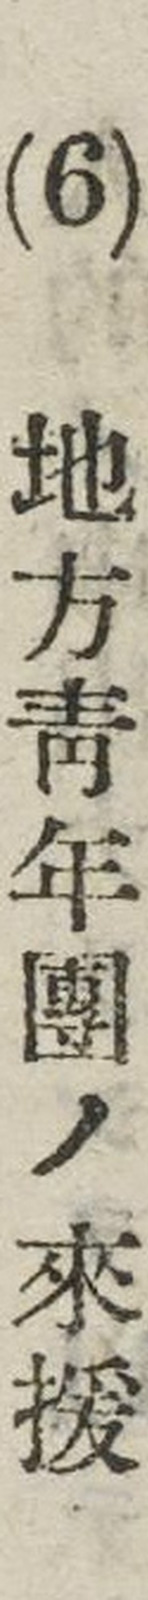⑹地方青年団ノ来援
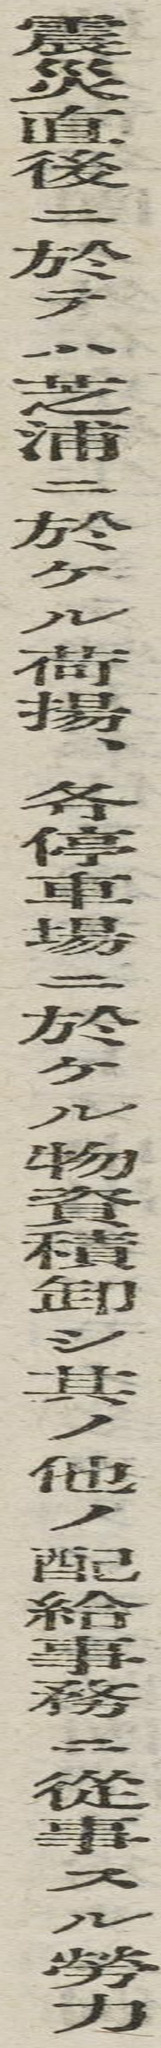震災直後ニ於テハ芝浦ニ於ケル荷揚、各停車場ニ於ケル物資積卸シ其ノ他ノ配給事務ニ従事スル労力
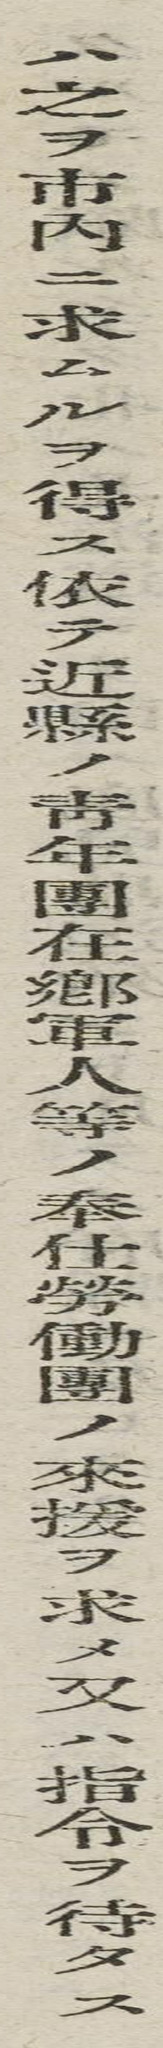ハ之ヲ市内ニ求ムルヲ得ス依テ近県ノ青年団在郷軍人等ノ奉仕労働団ノ来援ヲ求メ又ハ指令ヲ待タス
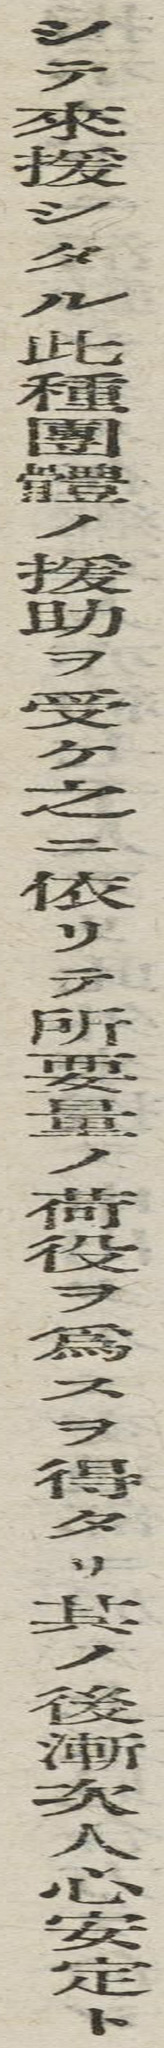シテ来援シタル此種団体ノ援助ヲ受ケ之ニ依リテ所要量ノ荷役ヲ為スヲ得タリ其ノ後漸次人心安定ト
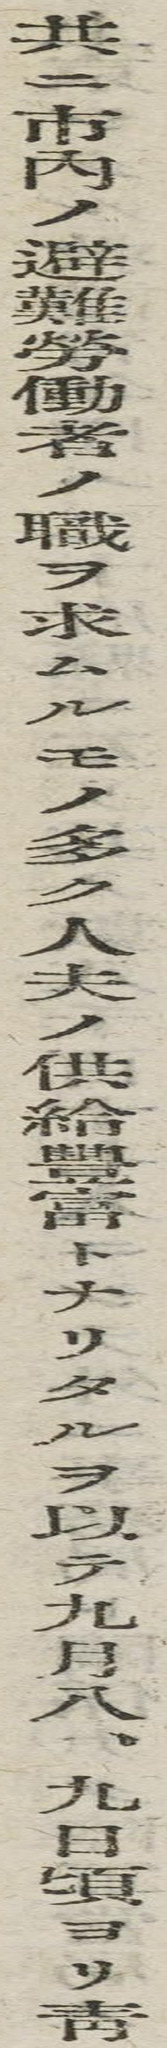共ニ市内ノ避難労働者ノ職ヲ求ムルモノ多ク人夫ノ供給豊富トナリタルヲ以テ九月八、九日頃ヨリ青
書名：震災被害状況並救護施設概要
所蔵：東京大学地震研究所図書室 Earthquake Research Institute Library, The University of Tokyo, JAPAN
